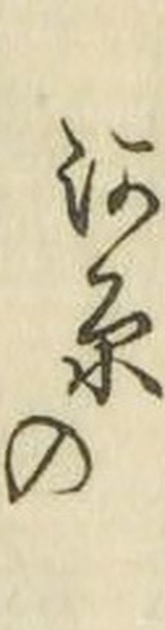河原の
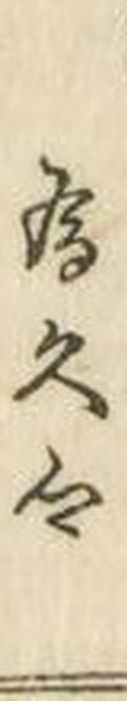為久卿
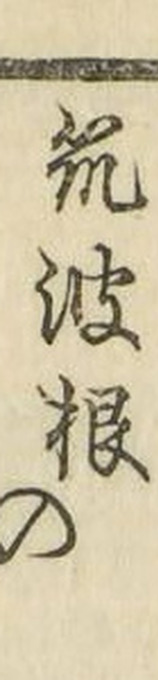筑波根の
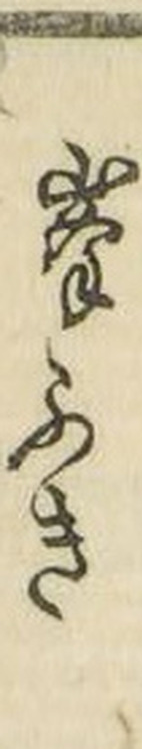峯ふき
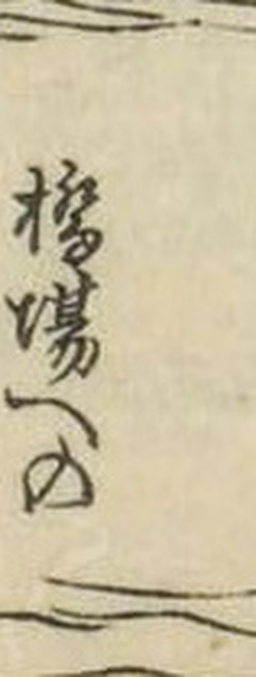橋場への
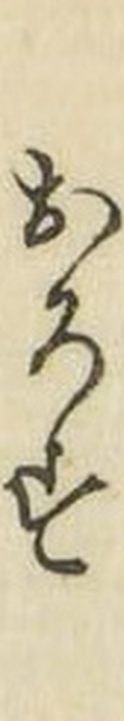おろす
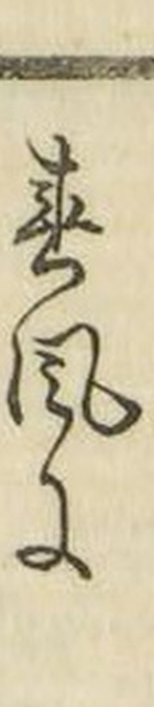春風に
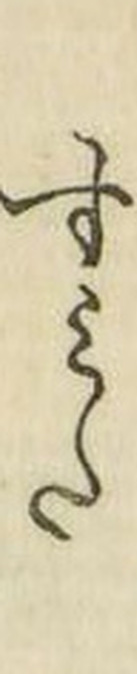すみた
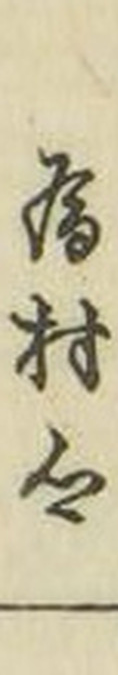為村卿

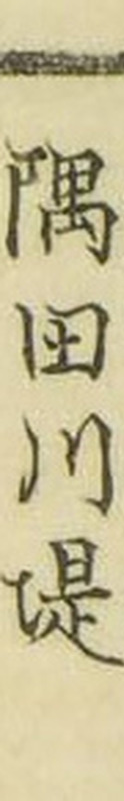隅田川堤
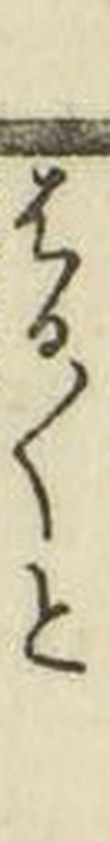はる〳〵と
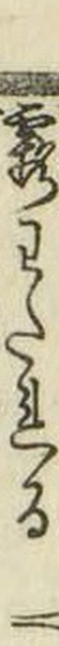霞わたれる
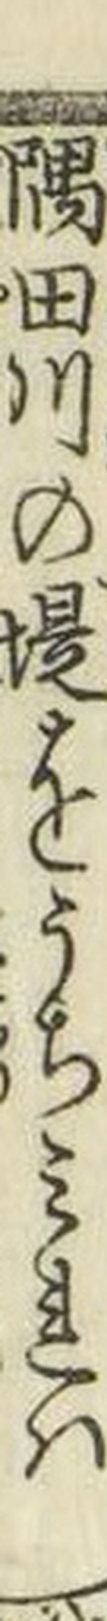隅田川の堤をうちみれは
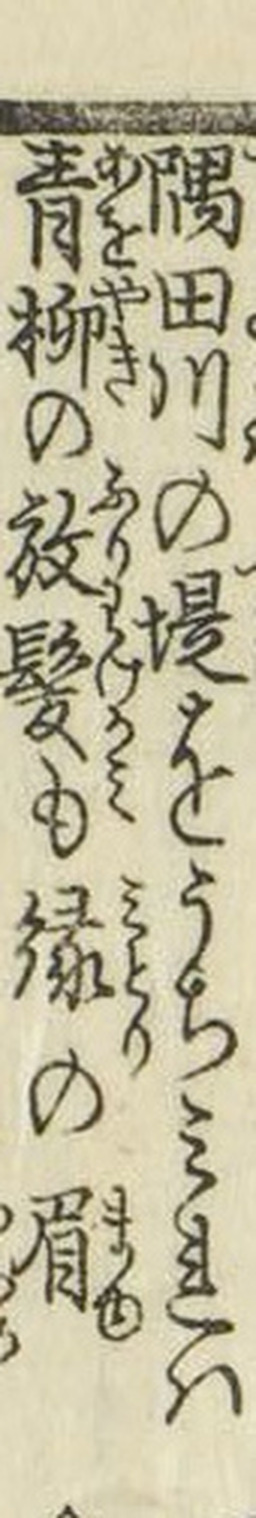青柳の放髪も緑の眉
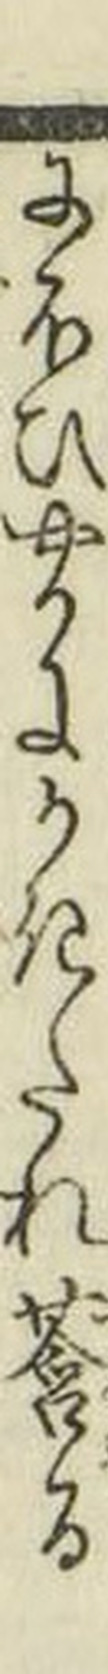にほひやかにかきたれ莟る
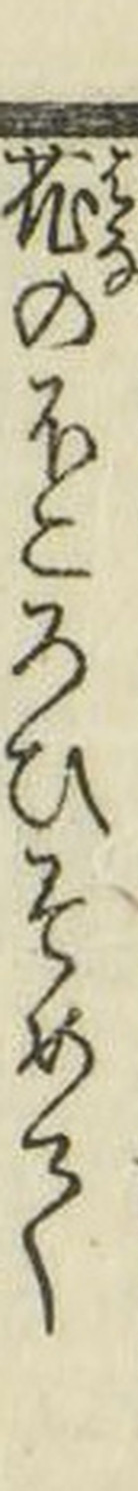花のほころひそめて
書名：江戸名所図会 20巻 巻之19
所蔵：東京学芸大学教育コンテンツアーカイブ
